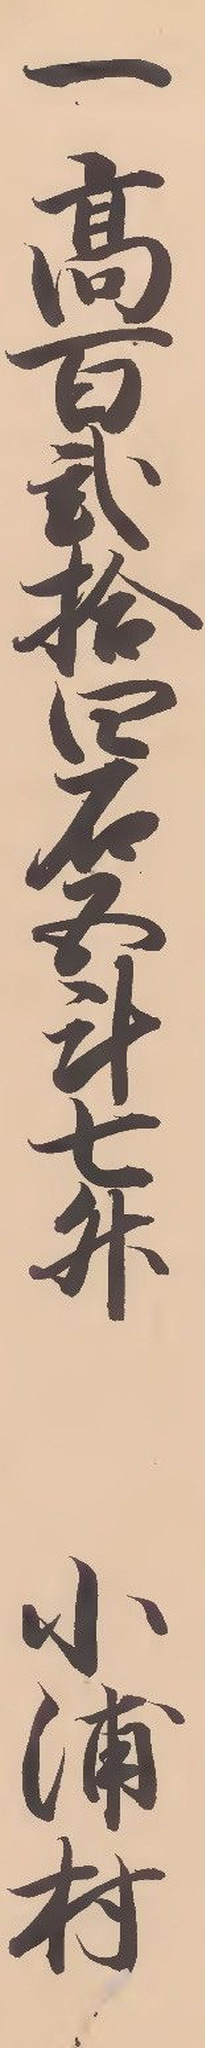一高百弐拾四石五斗七升小浦村
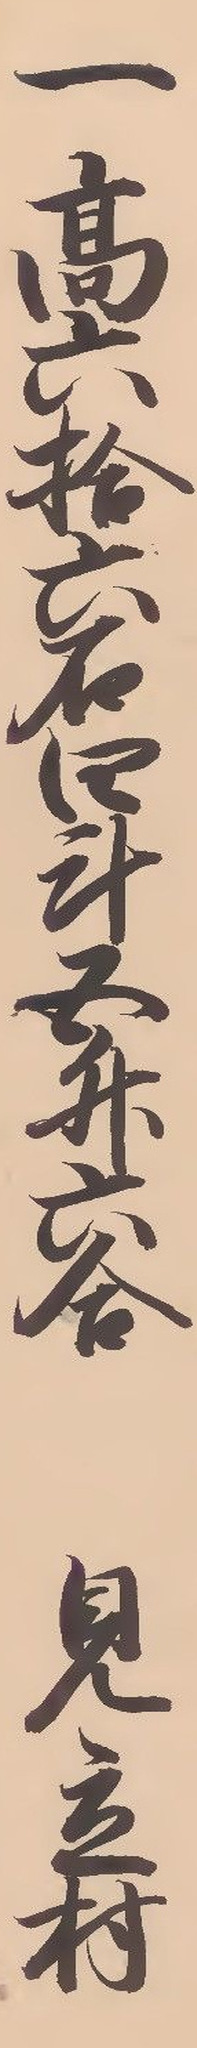一高六拾六石四斗五升六合見立村

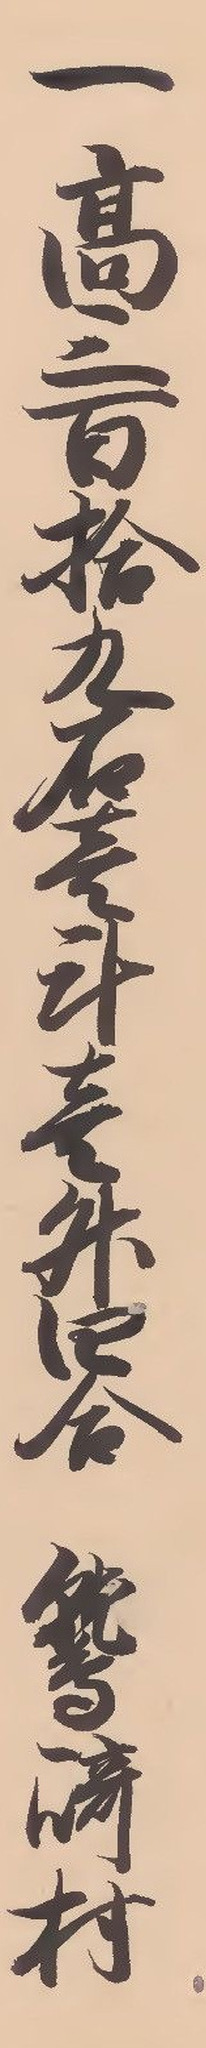一高三百拾九石壱斗壱升四合鷲崎村
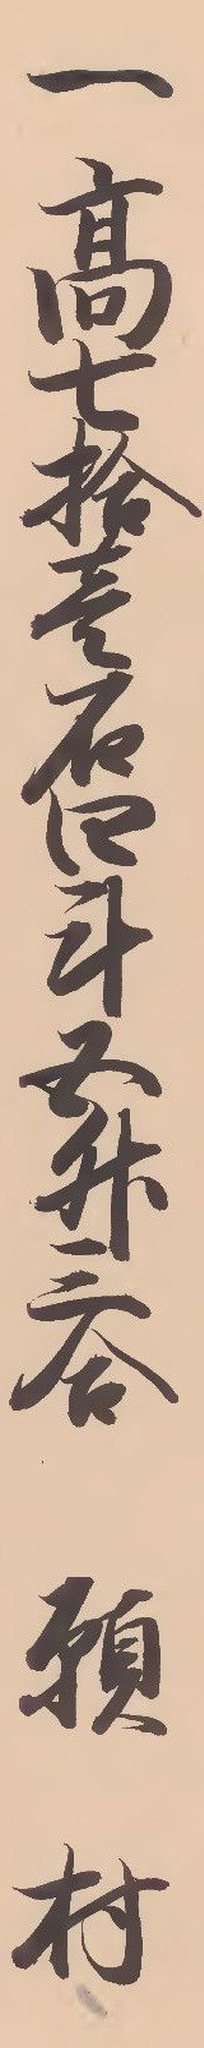一高七拾壱石四斗五升三合願村
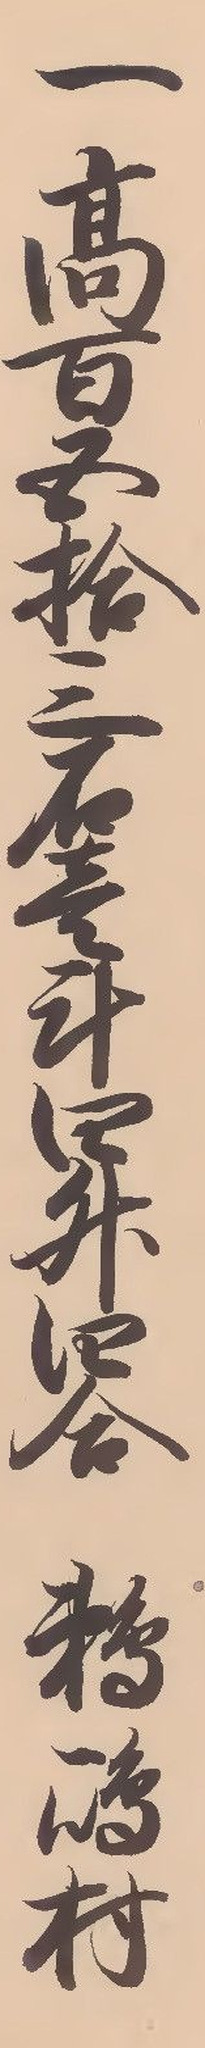一高百五拾三石壱斗四升四合鵜崎村
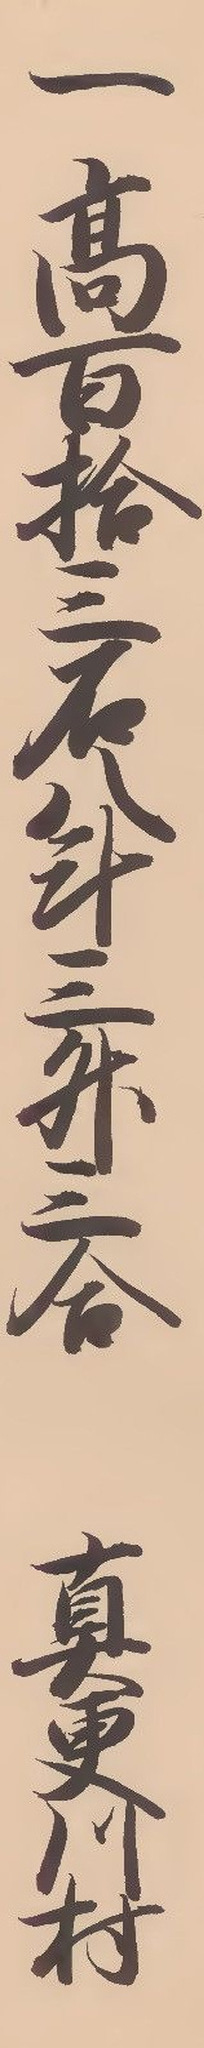一高百拾三石八斗三升三合真更川村
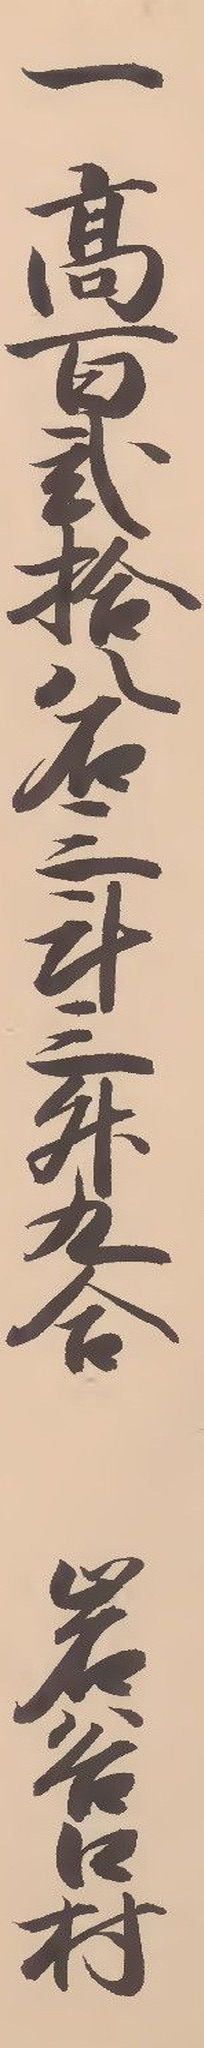一高百弐拾八石三斗三升九合岩谷口村
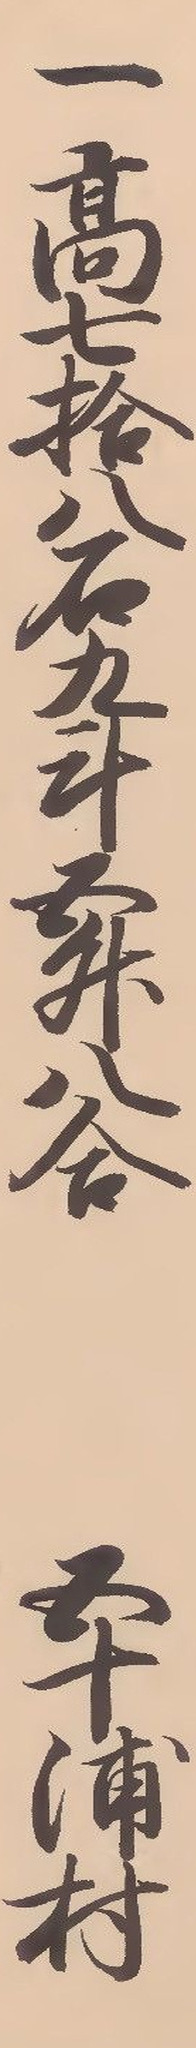一高七拾八石九斗五升八合五十浦村
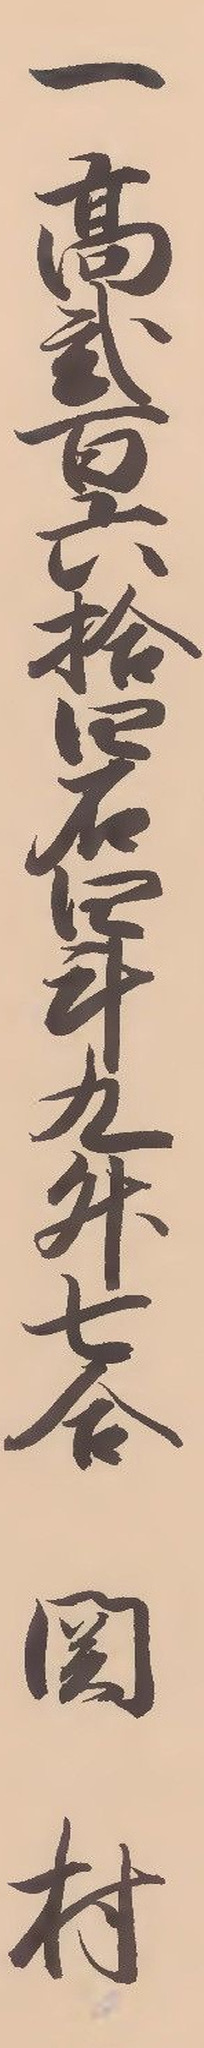一高弐百六拾四石四斗九升七合関村
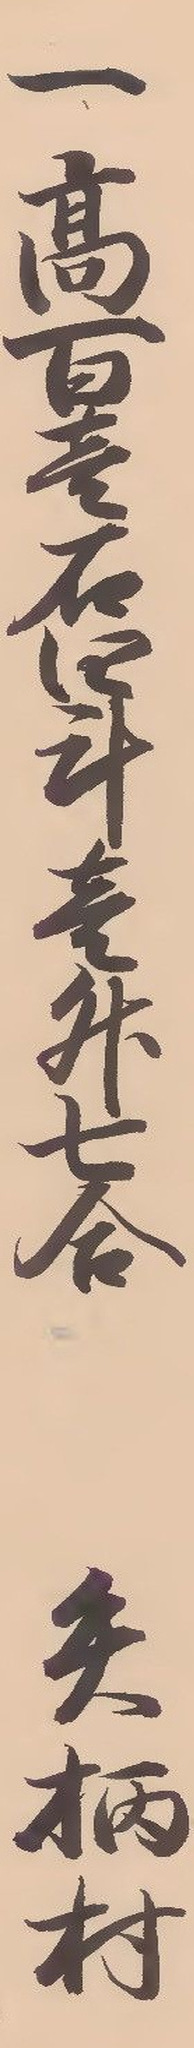一高百壱石四斗壱升七合矢柄村

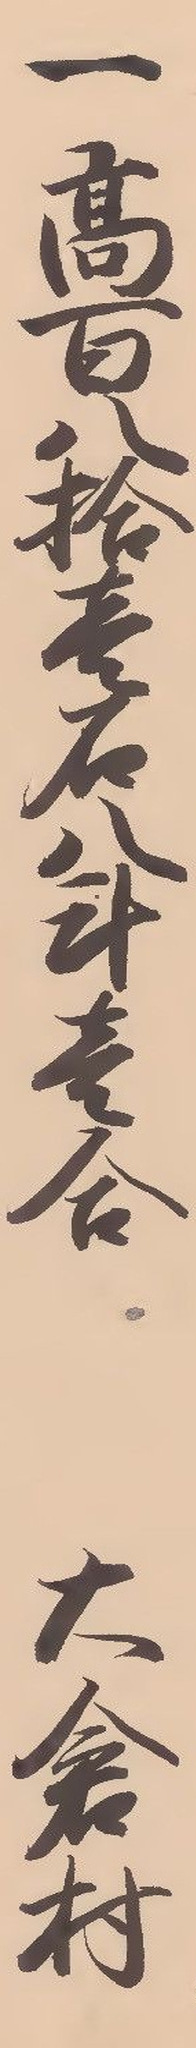一高百八拾壱石八斗壱合大倉村
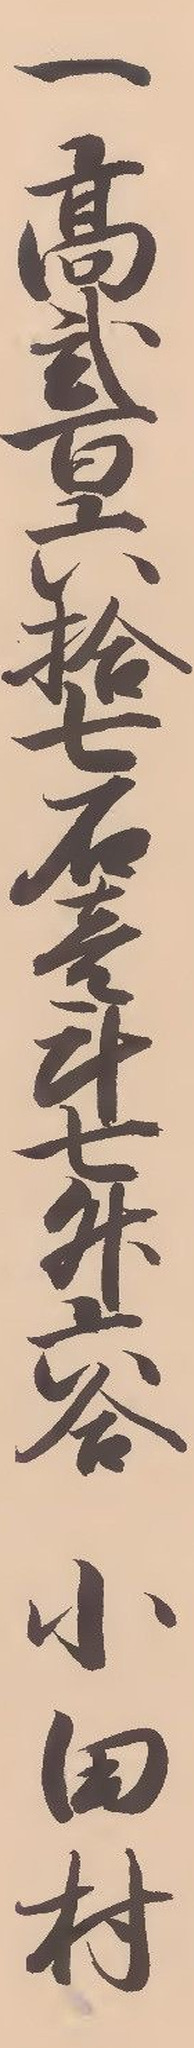一高弐百六拾七石壱斗七升六合小田村
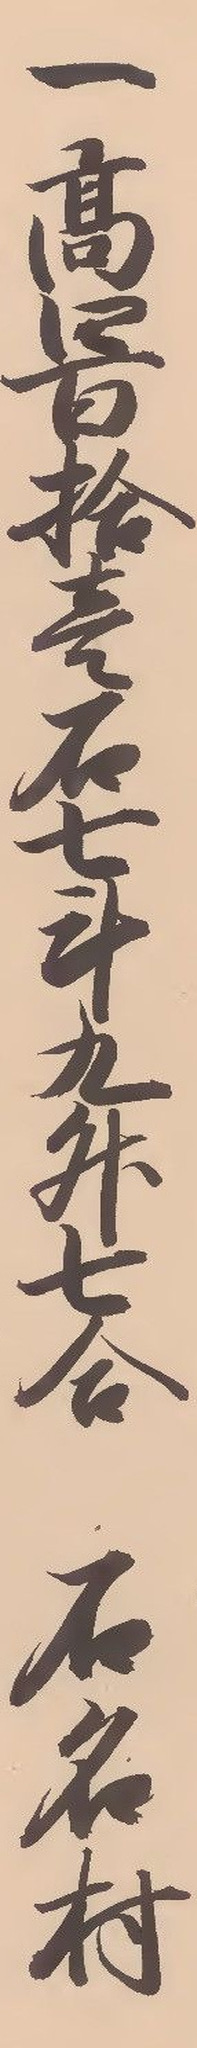一高四百拾壱石七斗九升七合石名村
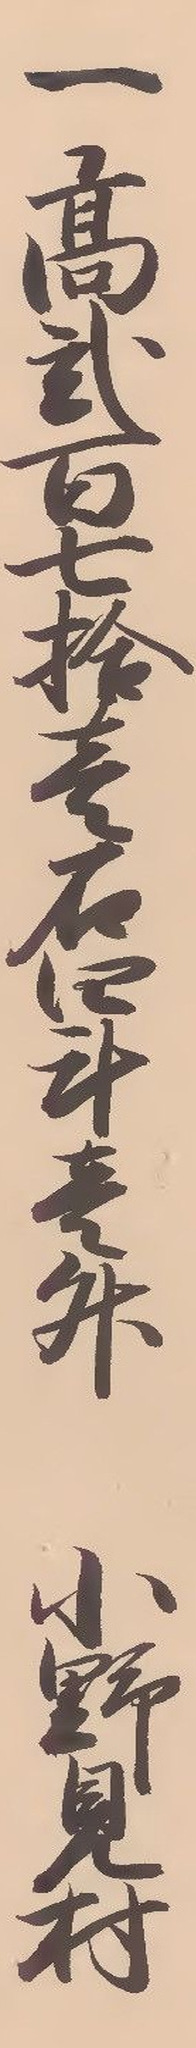一高弐百七拾壱石四斗壱升小野見村
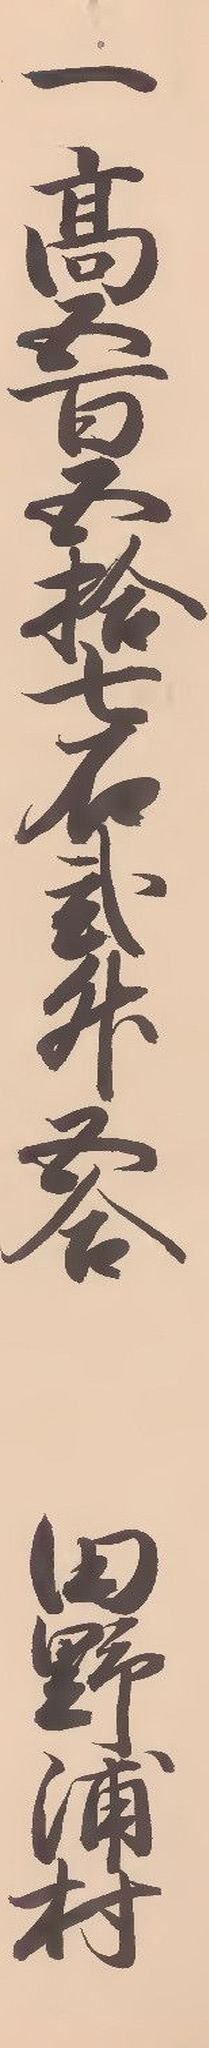一高五百五拾七石弐升五合田野浦村
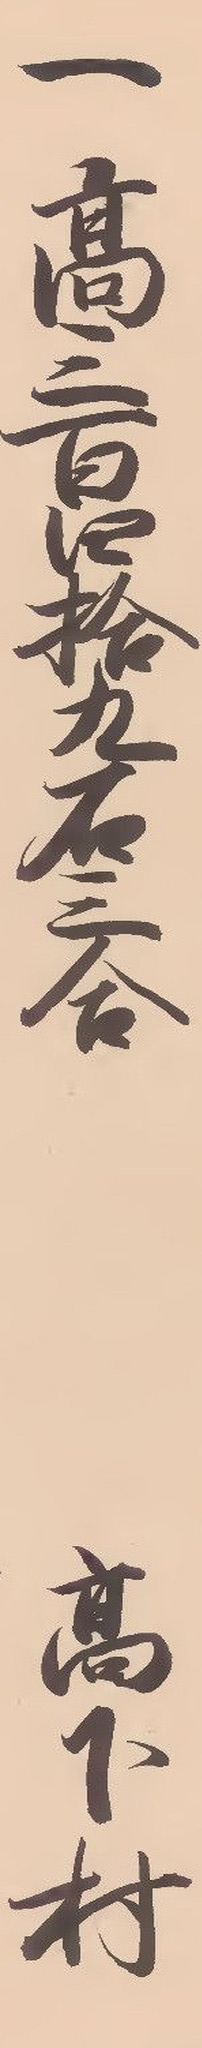一高三百四拾九石三合高下村
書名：佐渡国郷帳
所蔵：国立公文書館 National Archives of Japan
